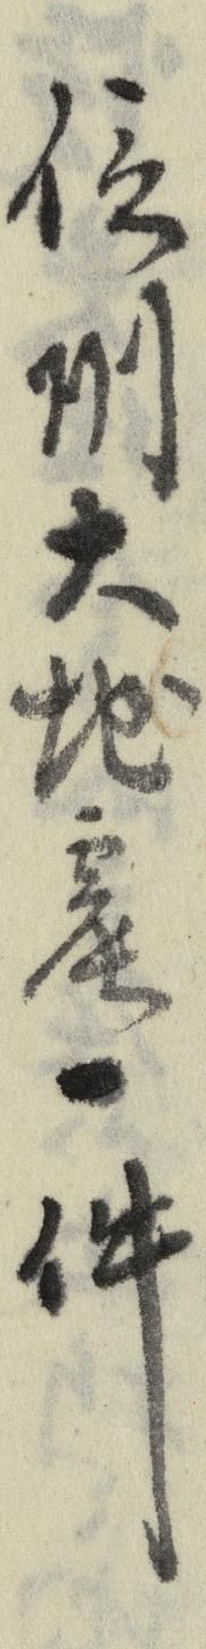信州大地震一件
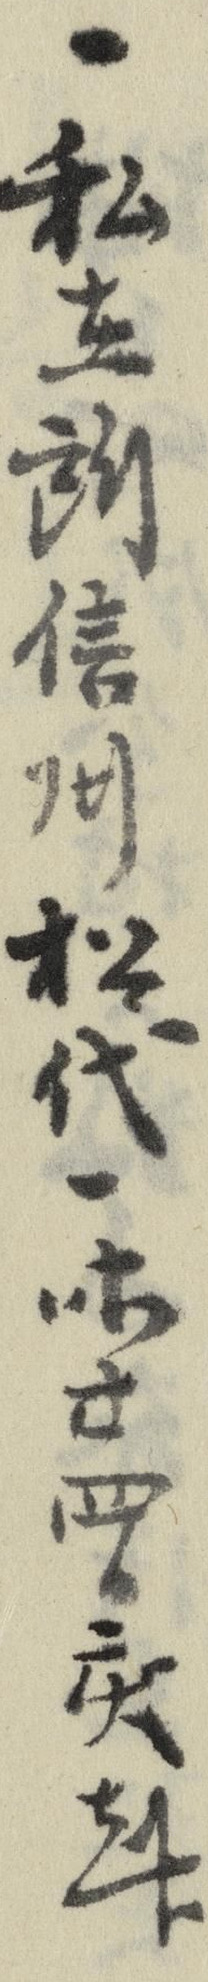一私在所信州松代一昨廿四日亥刻
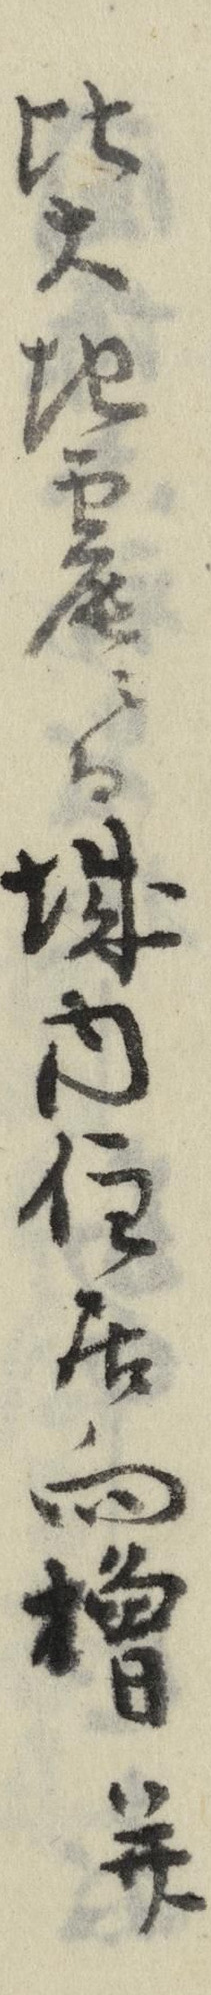比大地震ニ而城内住居向櫓并
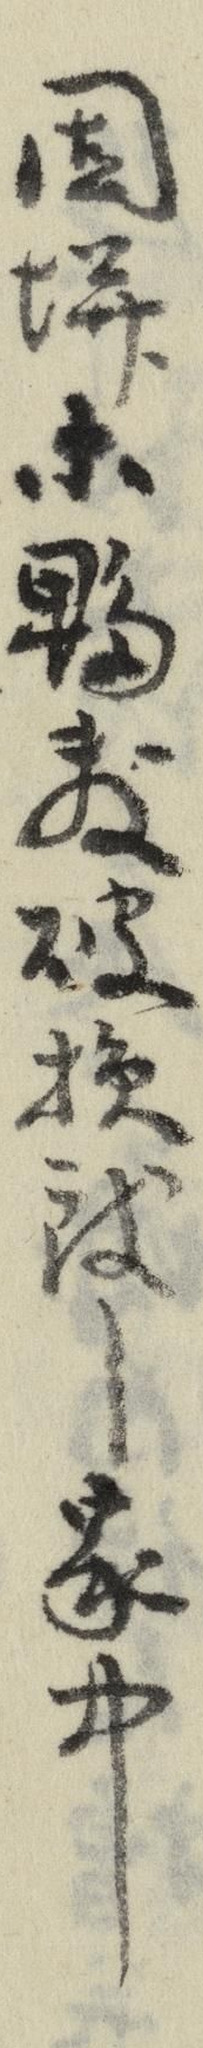固塀等夥敷破損致し家中
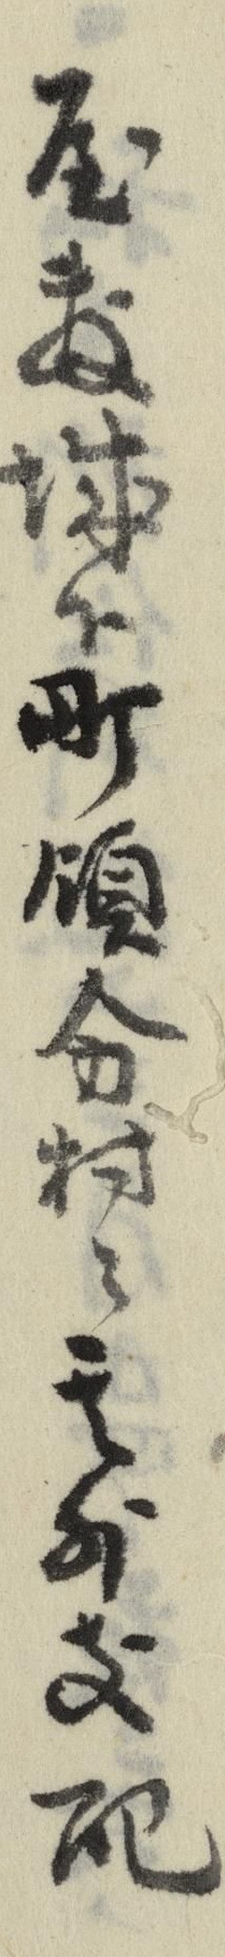屋敷城下町領分村々其外支配
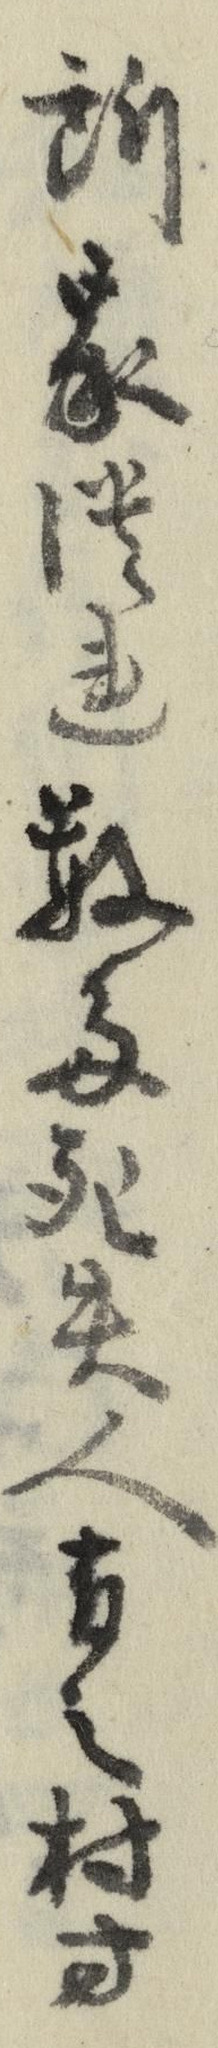所家潰れ数多死失人有之村方
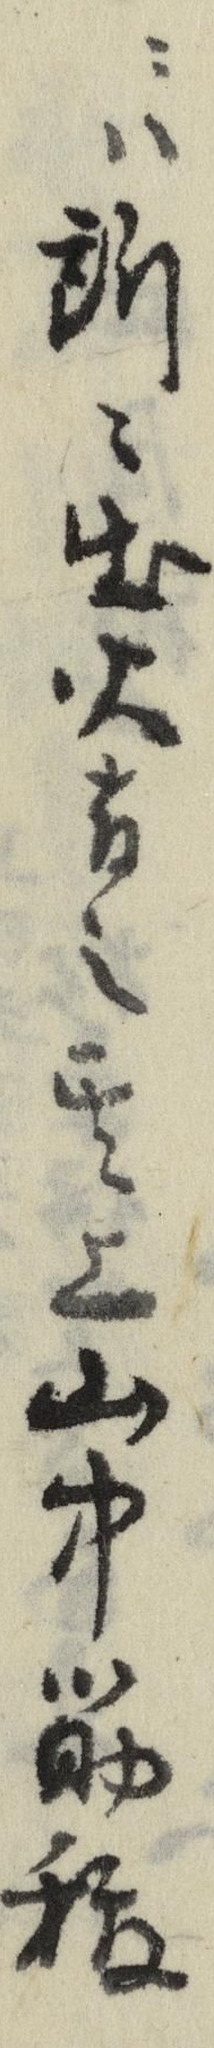ニハ所々出火有之其上山中筋抜
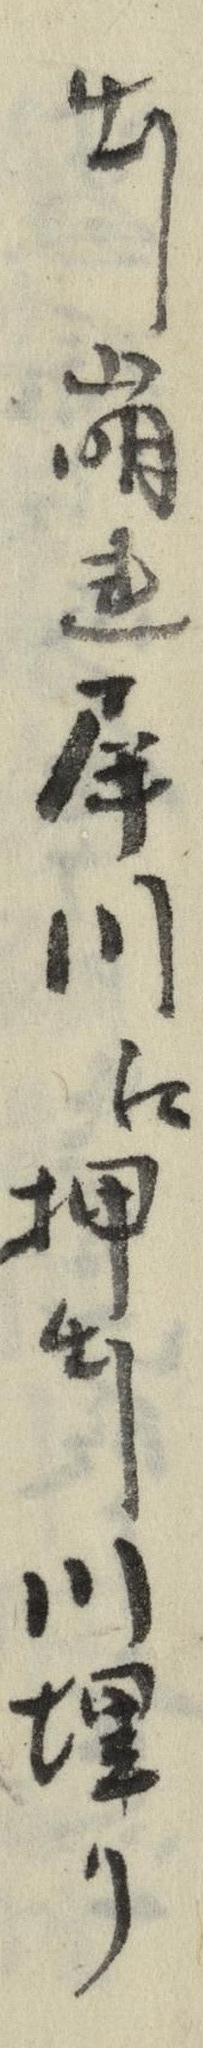出し崩れ犀川え押出し川埋リ
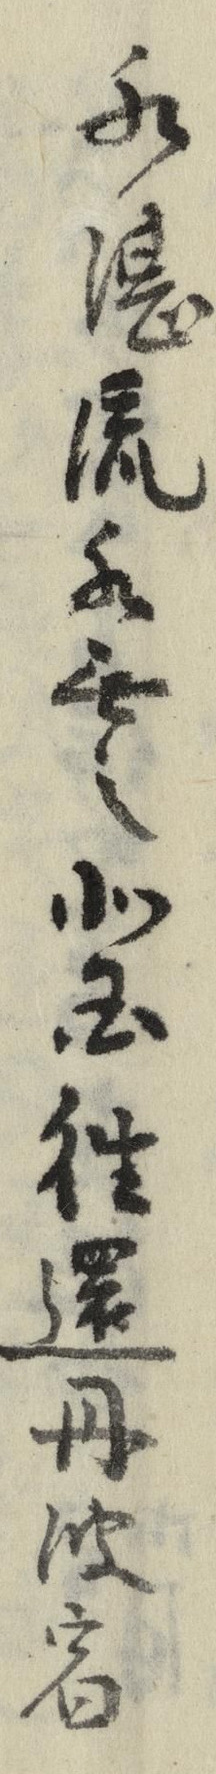水湛流水無之北国往還丹波宿
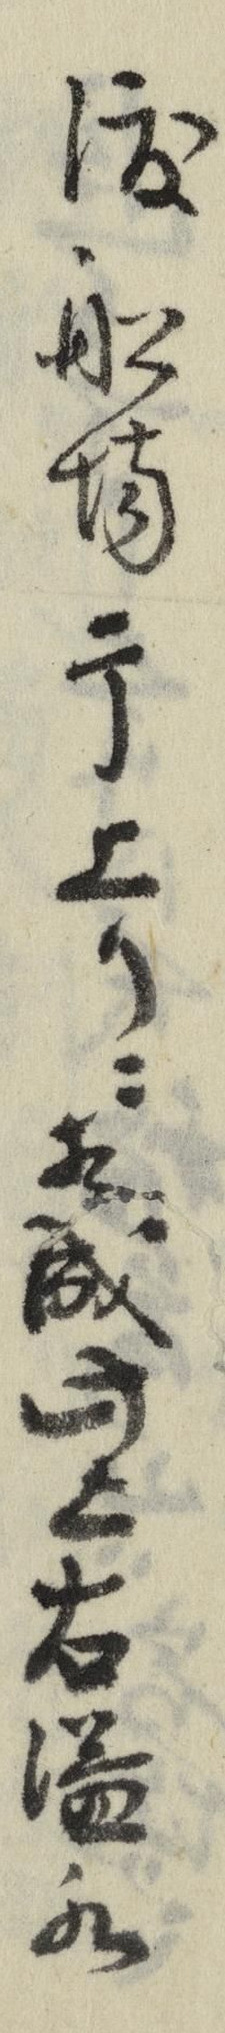渡船場干上リニ相成此上右溢水
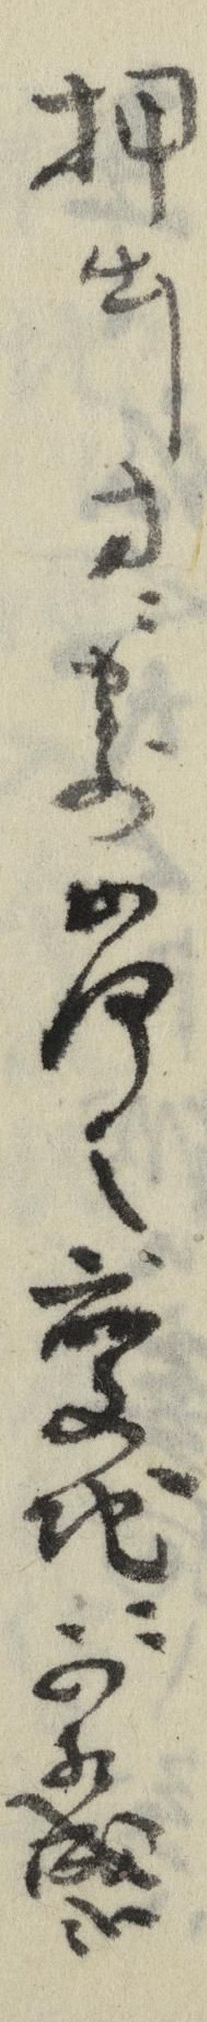押出し方二寄如何之変地に可相成哉
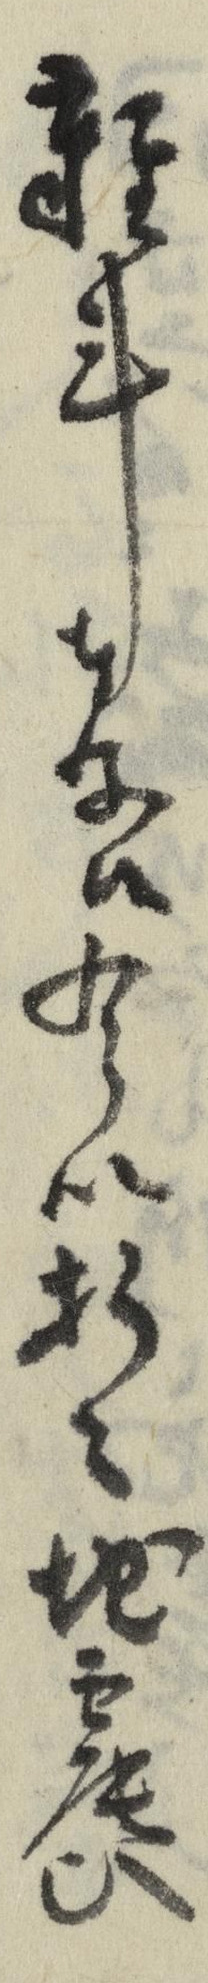難計奉存候今以折々地震ひ
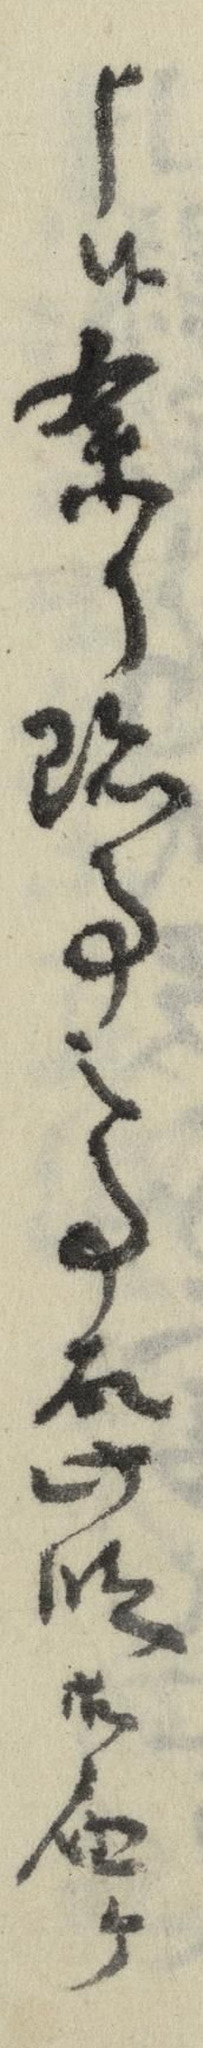申候余リ珍事之事故此段御届ケ
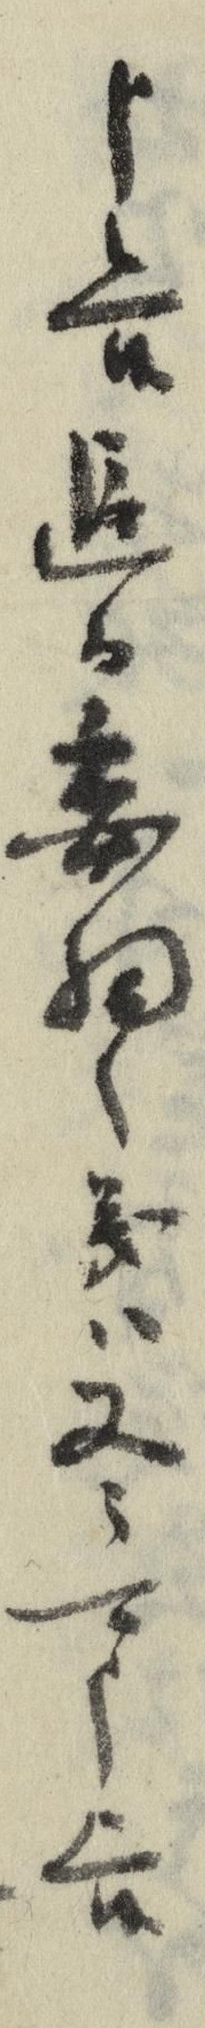申上候追而委細之義ハ又々可申上候
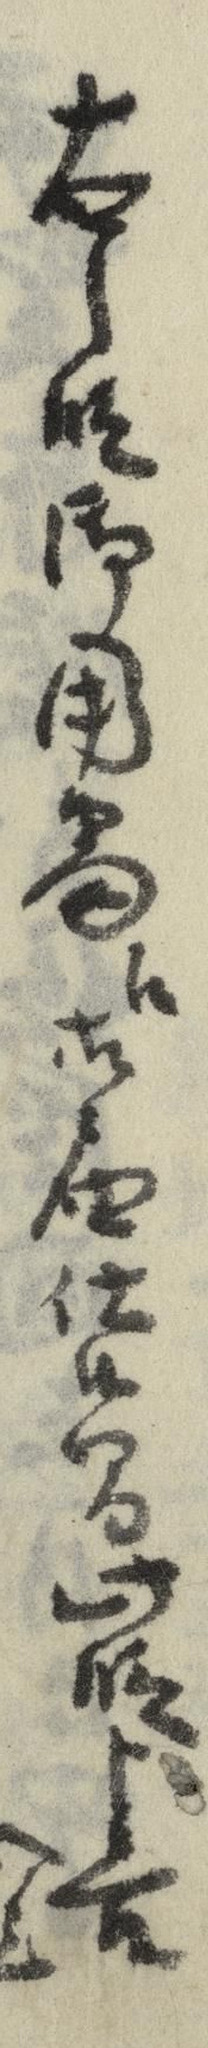右之段御用番え御届仕候間此段申上候

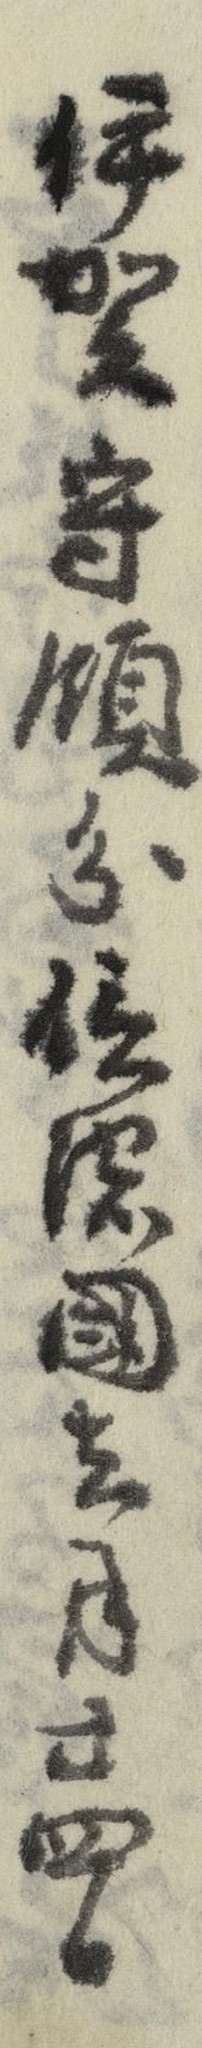伊賀守領分信濃国去月廿四日
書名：信州大地震一件之冩　丁未弘化四年三月吉日
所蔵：東京大学地震研究所図書室 Earthquake Research Institute Library, The University of Tokyo, JAPAN
